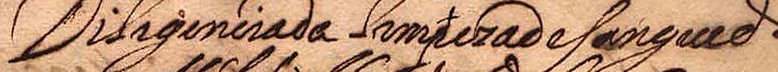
Diligencia da limpeza de Sangue de
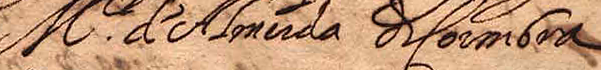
M.el d'Almeida de Coimbra
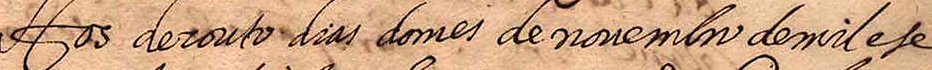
Aos dezouto dias do mes de nouembro de mil e se
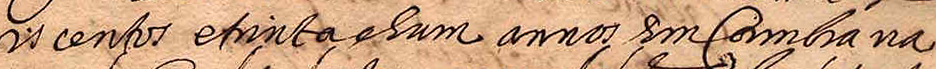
iscentos e trinta e hum annos Em Coimbra na
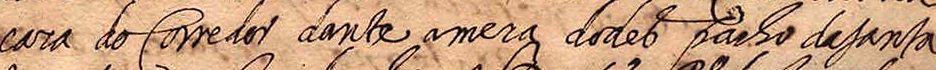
caza do Corredor dante a meza do despacho da santa
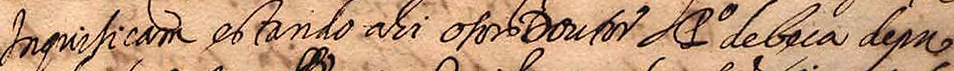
Inquisicam estando ahi o sor Doutor Po de beça depu
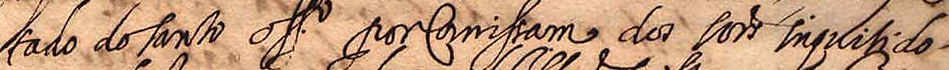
tado do Santo off.o por Comissam dos Sors Inquisido
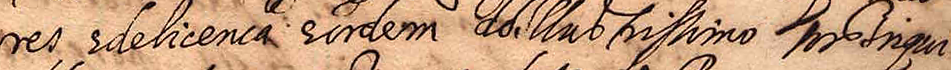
res, E de licença E ordem do Illustrissimo sor Inqui
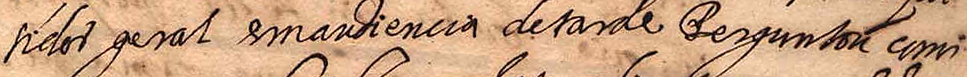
sidor geraL Em audiencia de tarde Perguntou comi
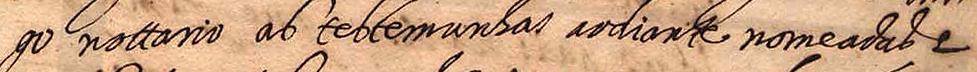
go nottario as testemunhas ao diante nomeadas E
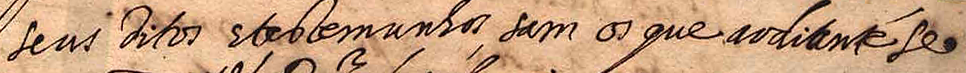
seus ditos E testemunhos, sam os que ao diante se
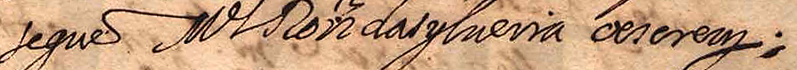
seguē Mel Roīz da sylueira o escreuj;
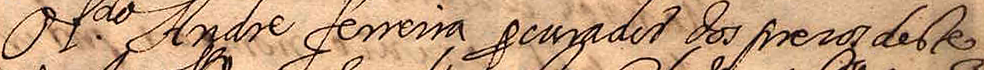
O L.do Andre ferreira ꝓcurador dos prezos deste
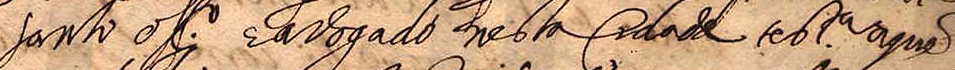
santo off.o E avogado nesta Cidade testa a quē
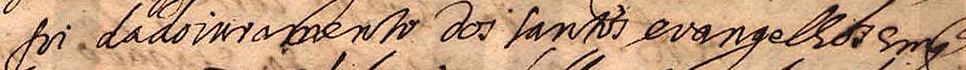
foi dado iuramento dos santos evangelhos Em q̄
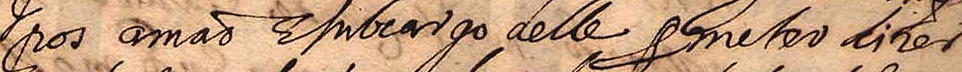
pos a maõ E sub cargo delle ꝓmeteo dizer
